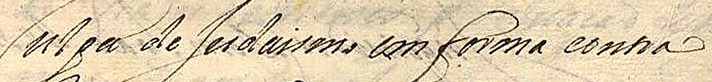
Culpa de Judaismo em forma contra
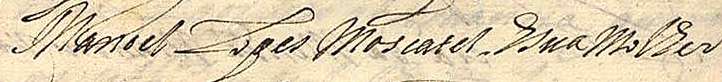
Manoel Lopes Moscatel E sua Molher
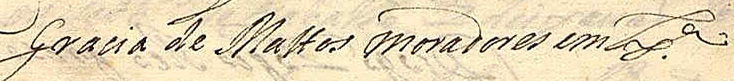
Gracia de Mattos moradores em Lx.a
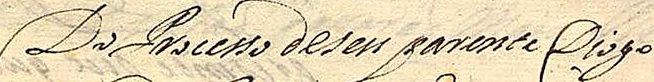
Do Processo de seu parente Diogo
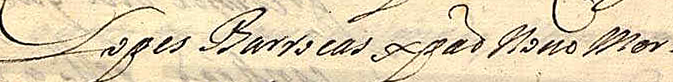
Lopes Barrocas xpão Nouo Mer
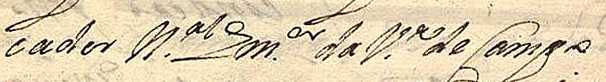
cador N.al E m.or da V.a de Campo
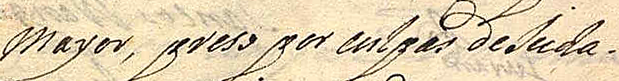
Mayor, preso por culpas de Iuda
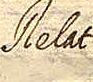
Relat
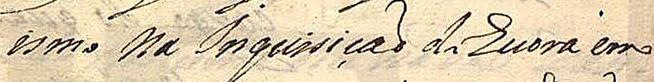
ismo na Inquisição de Euora em
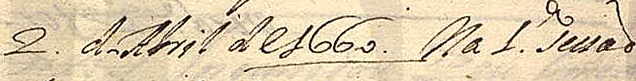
.2. de Abril de 1660. Na 1.a sessão
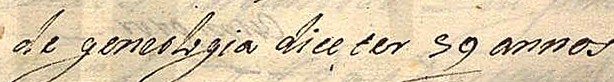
de geneologia dice ter 59 annos
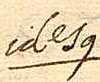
ide 59
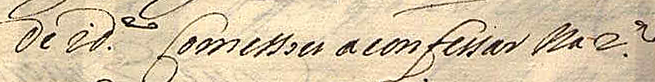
de id.e Comessou a confessar Na 2.a
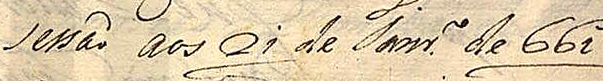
sessão aos 2i de Ianr.o de 66i
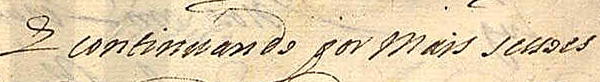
E continuando por mais sessoes
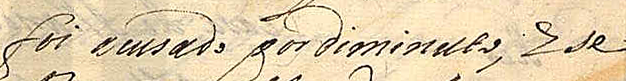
foi acusado por diminuto, E se
